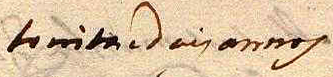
trinta e dois annos
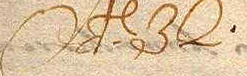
Jd̄.e 32.
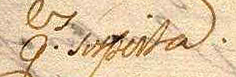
g.es sospeita.
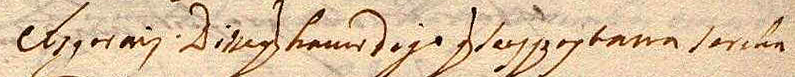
As gerais. Disse q̄ hauer digo q̄ suspeitaua ser cha
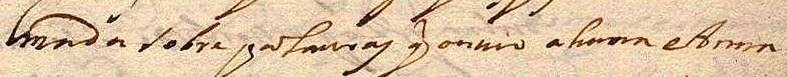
mada sobre palauras q̄ ouviu a huma Anna
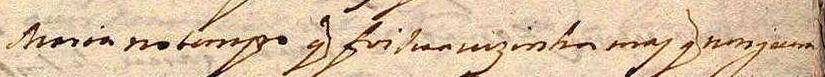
Maria no tempo q̄ foi sua vizinha mas q̄ ninguem
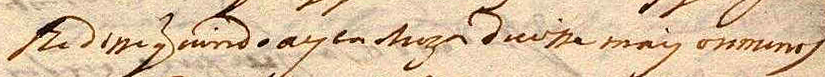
lhe disse q̄ uindo a esta Meza dicesse mais ou menos
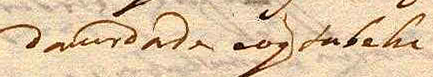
da uerdade e o q̄ sabe he
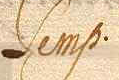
Temp.
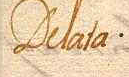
Delata.
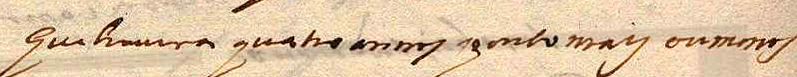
Que hauera quatro annos pouco mais ou menos
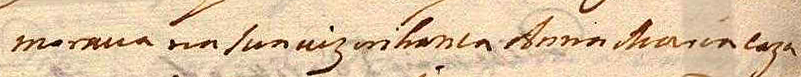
moraua na sua vizinhança Anna Maria caza
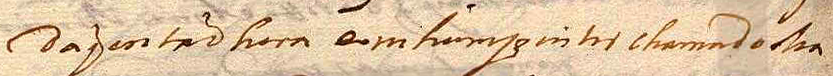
da q̄ entaõ hera com hum pintor chamado Ma
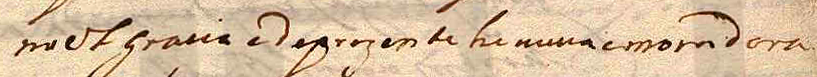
noel Gracia e de prezente he uiua e moradora
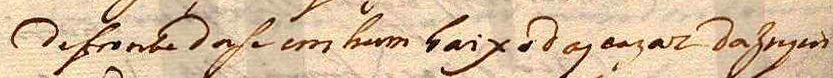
defronte da se em hum baixo das cazas da Jnqui
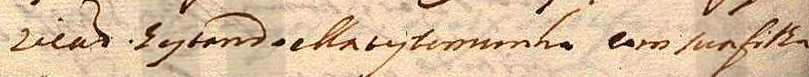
ziçaõ. E estando ella testemunha com sua filha
